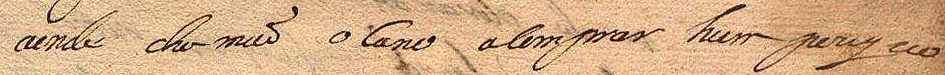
aonde chamaõ o Cano a comprar hum pouquo
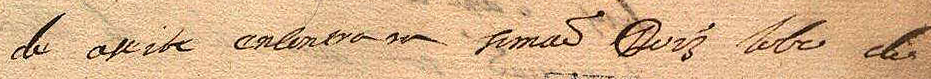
de aseite encontrara simaõ Roiz̄ lobo dis
